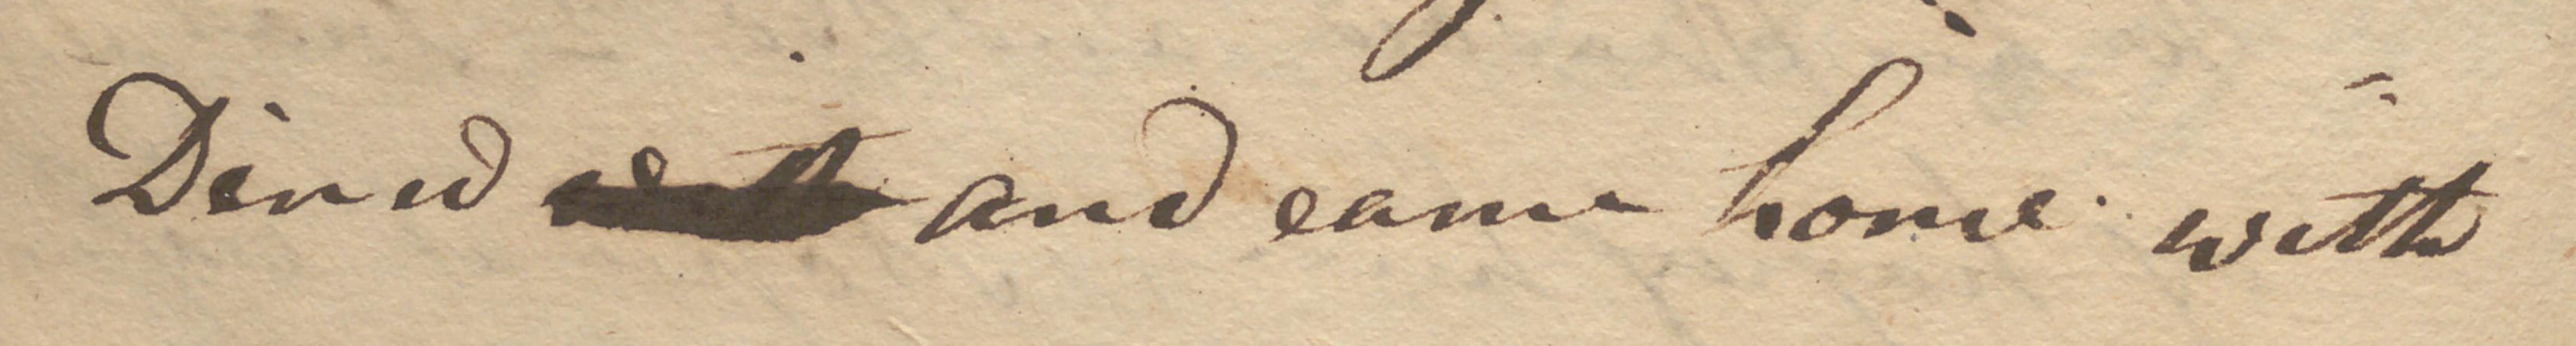Dined [with] and came home; with
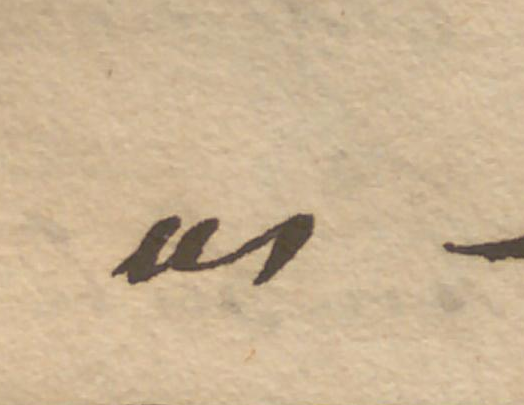us
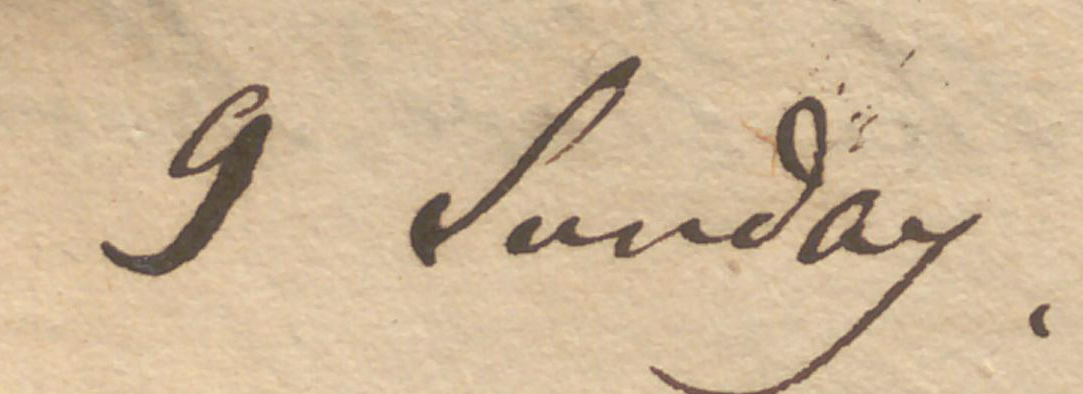9 Sunday
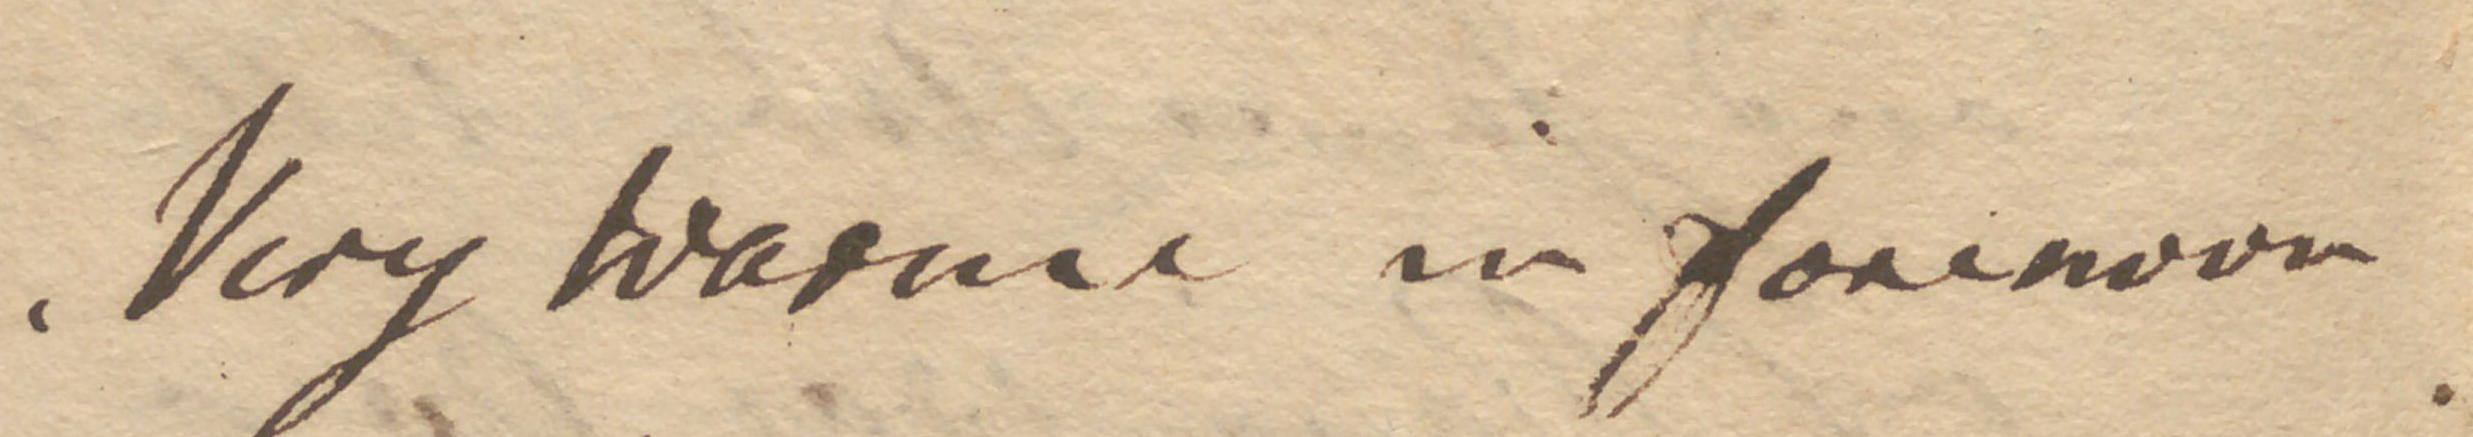Very warme in forenoon
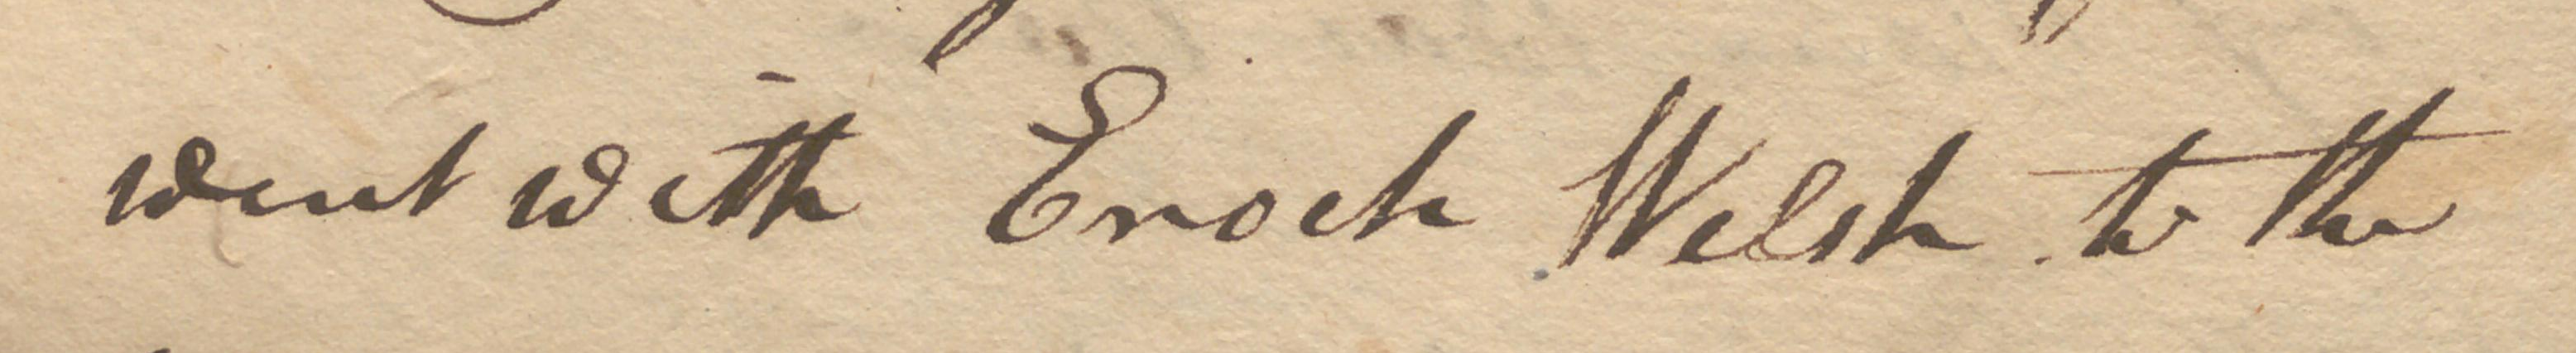went with Enoch Welsh to the
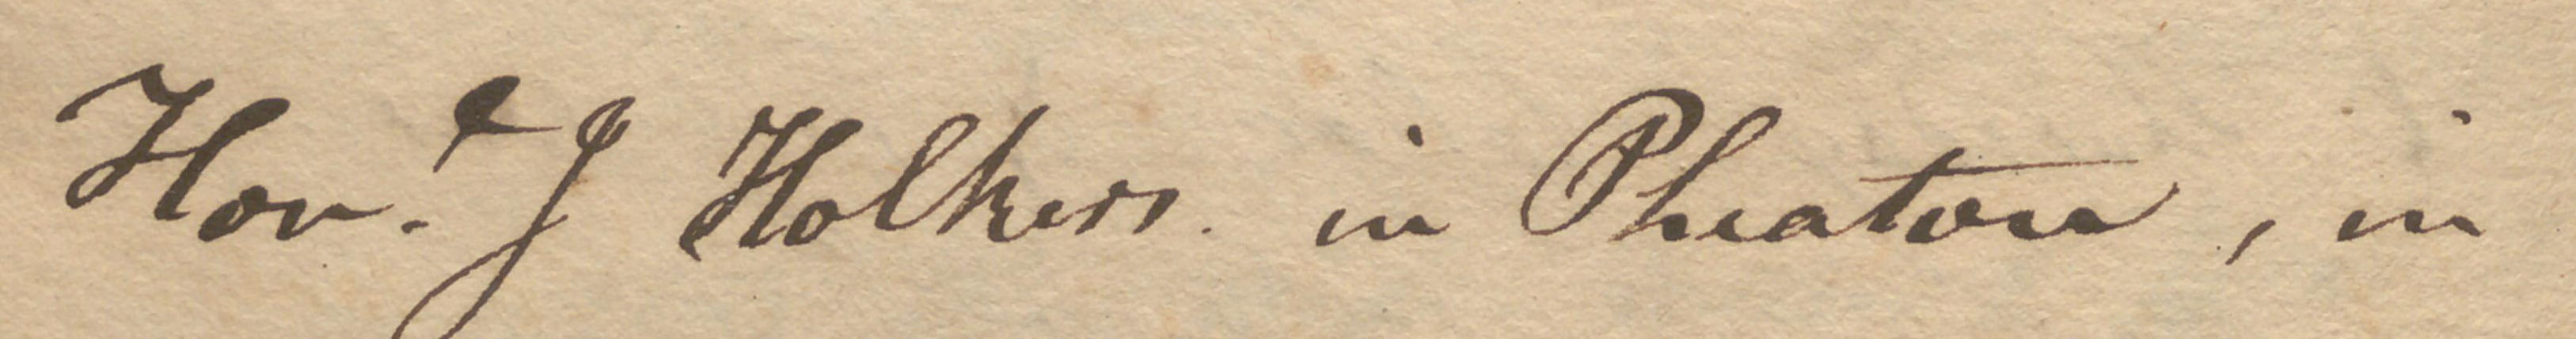Hon^l. J Holkers in Pheaton, in
